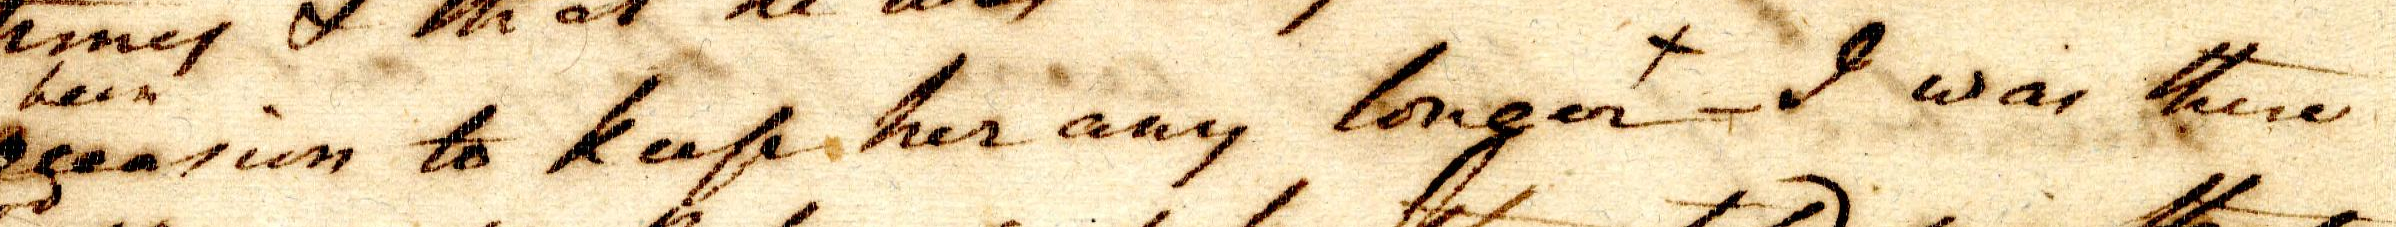reason to keep her any longer. I was there
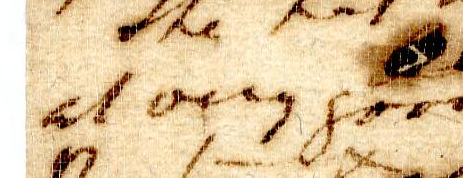at very good
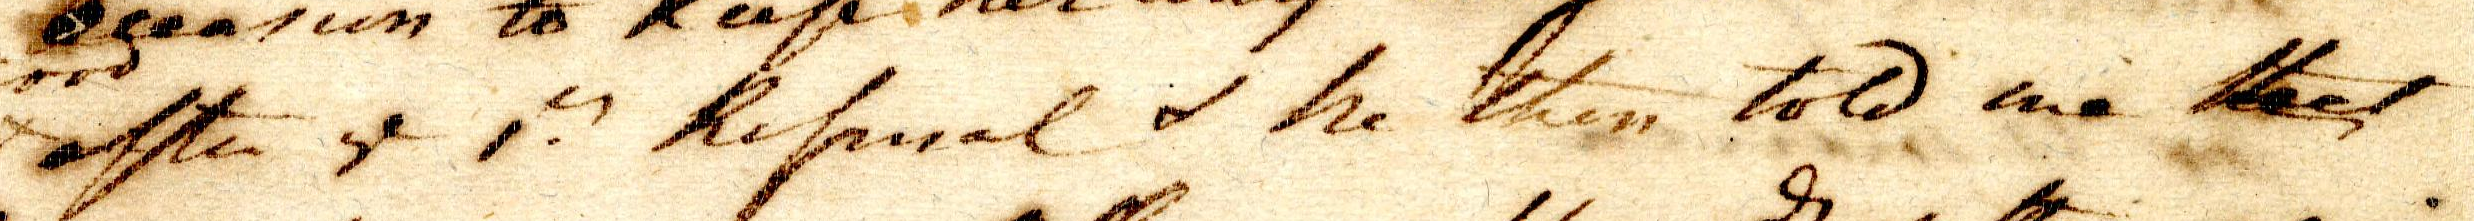after y^e 1^st Refusal & he then told me that
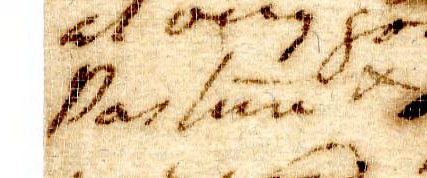Pasture &
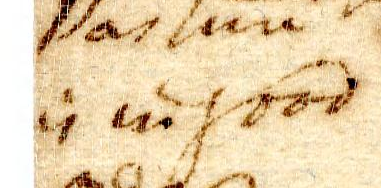is in good
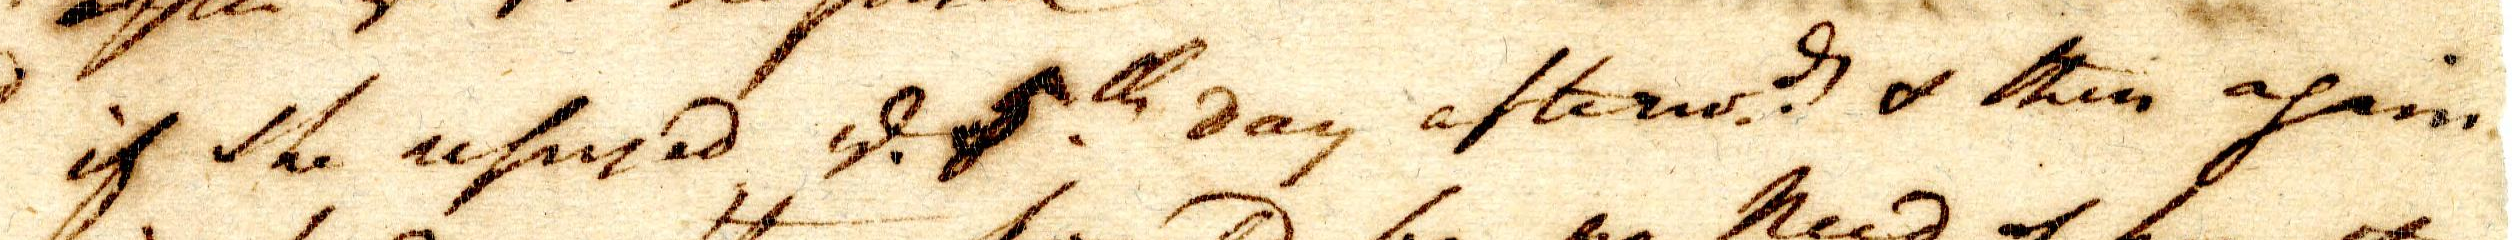if she refused y^e. 5^th day afterw^ds & then again
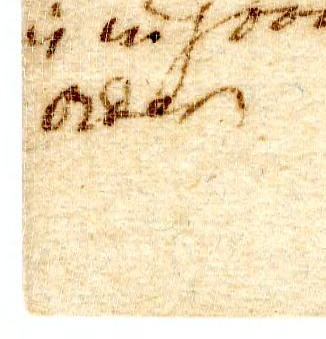order
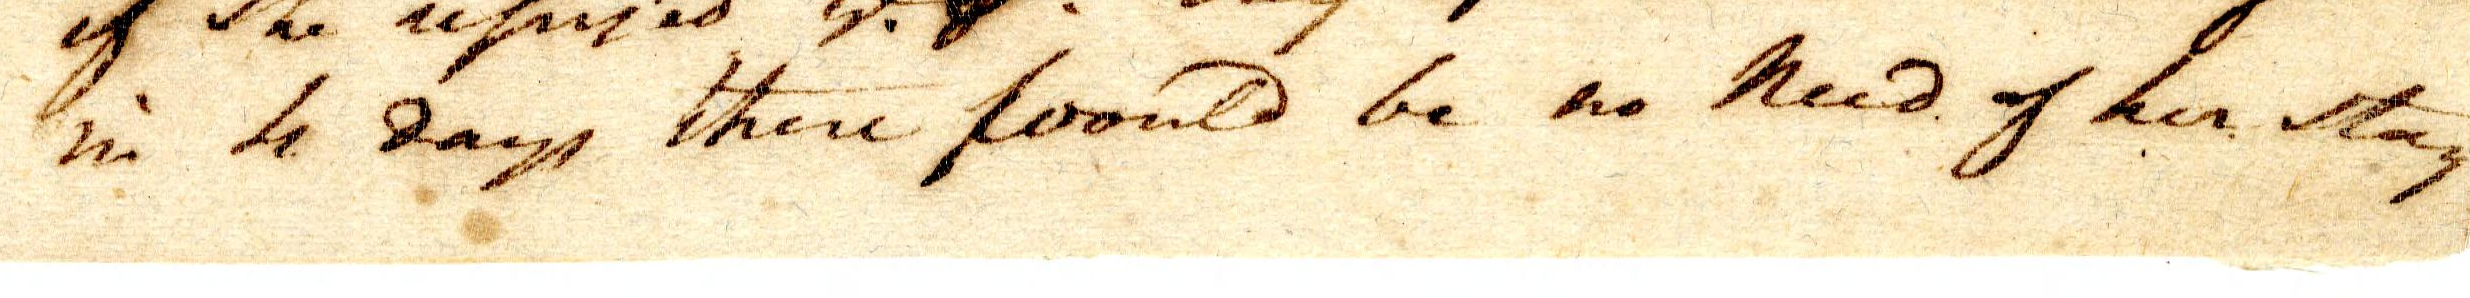in 4 days there would be no needer stay
